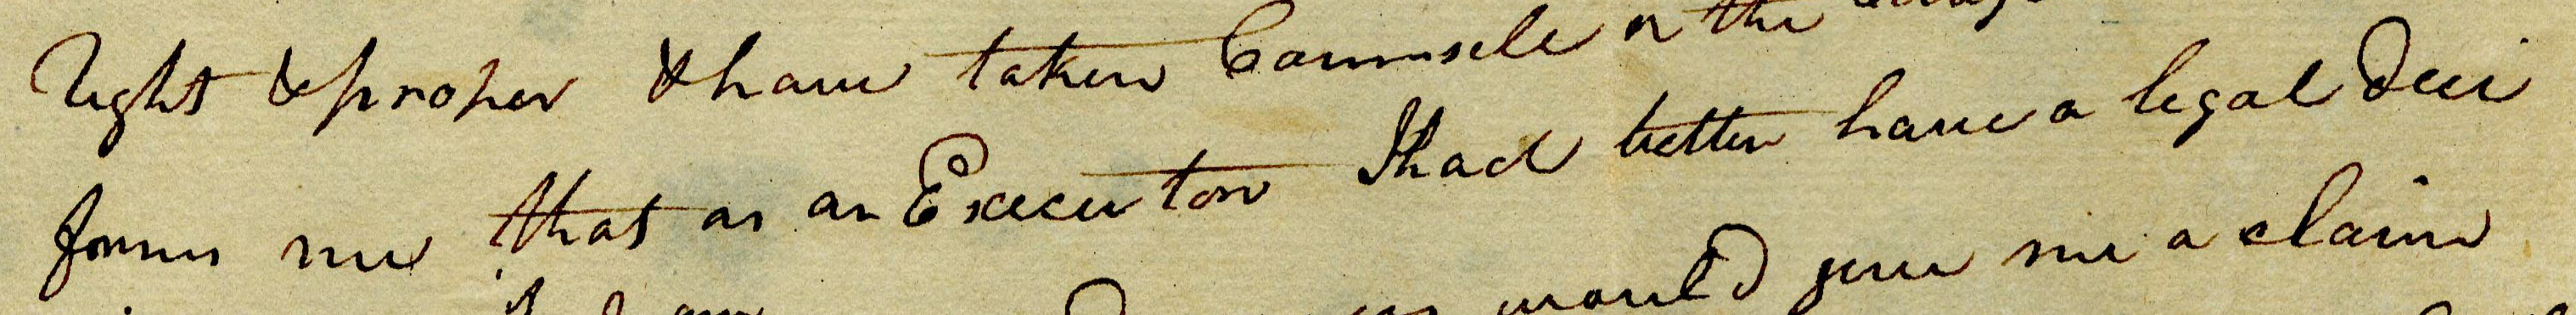forms me that as an Executor Shad better have a legal deci
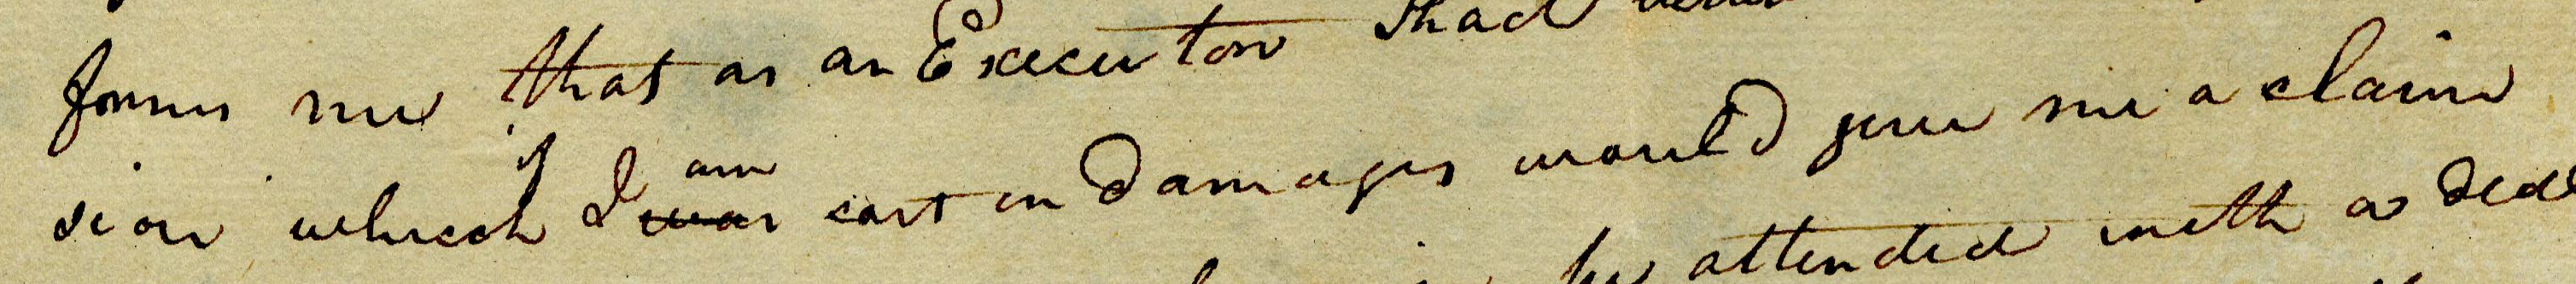scion which ^if I am cart in damages would give me a claim
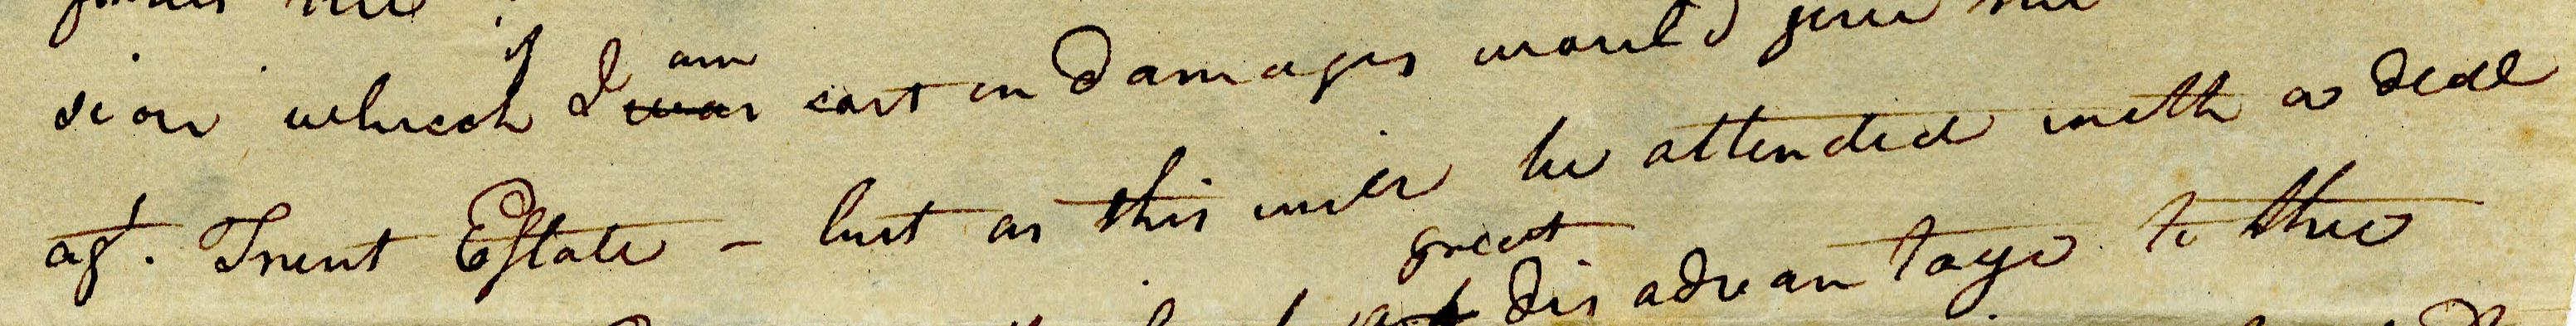ag^t. Trent Estate - but as this will be attended with a deal
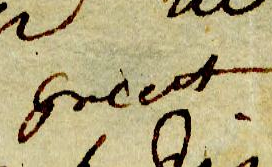great
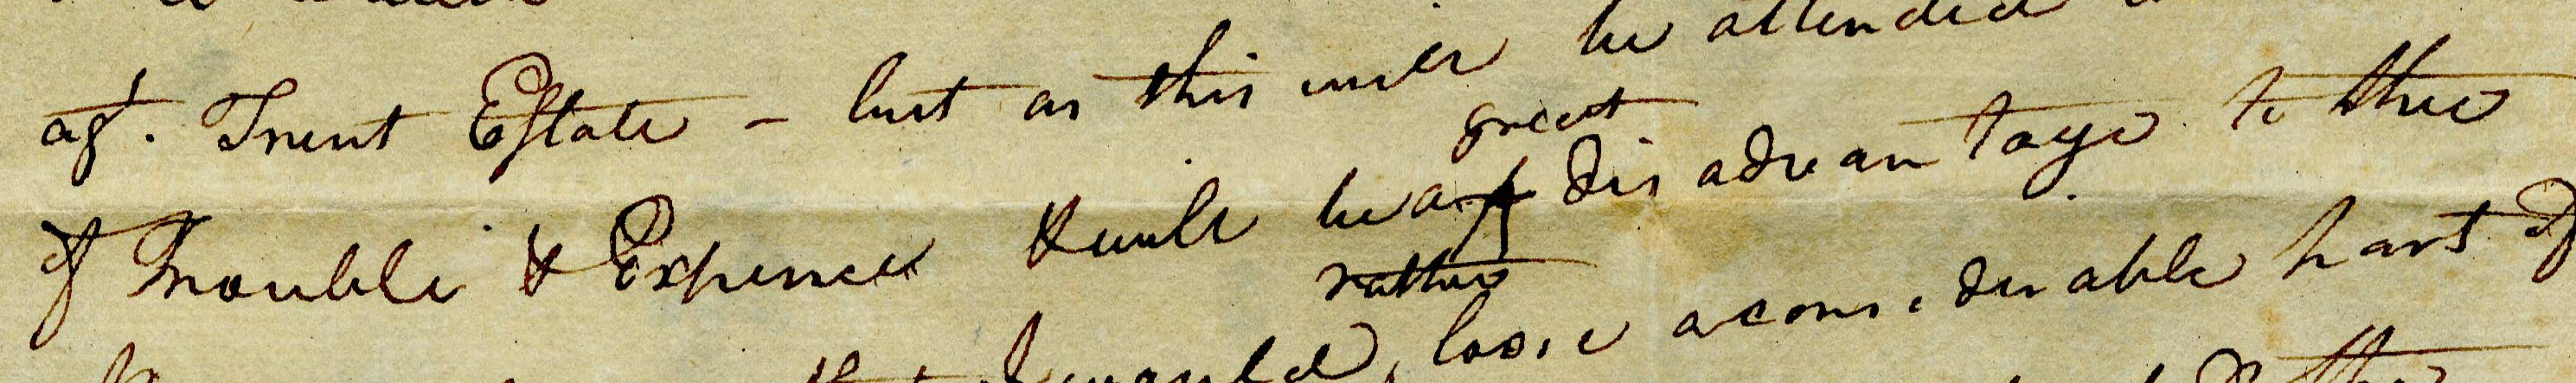of Trouble & Expense & will be a ^ disadvantage to thee
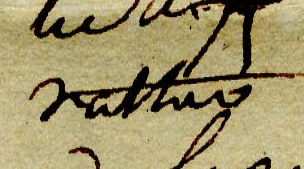rather
